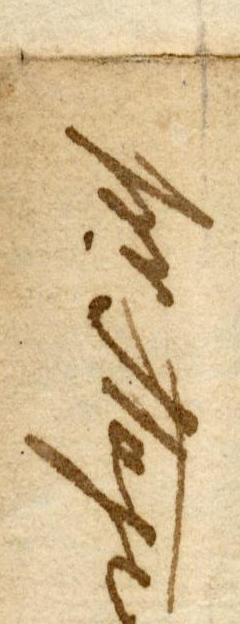per Stage
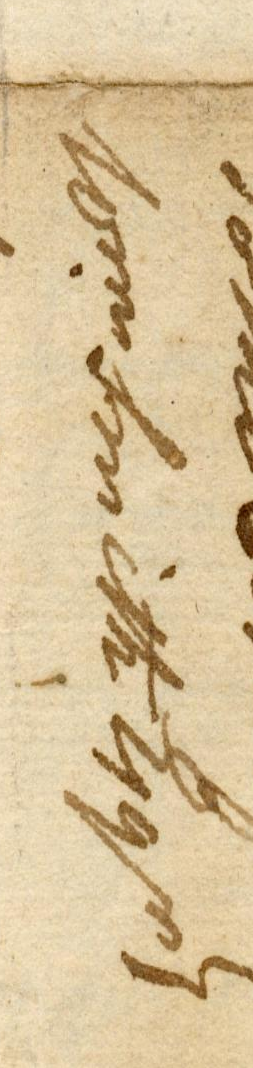to M^r Smith Esq^r
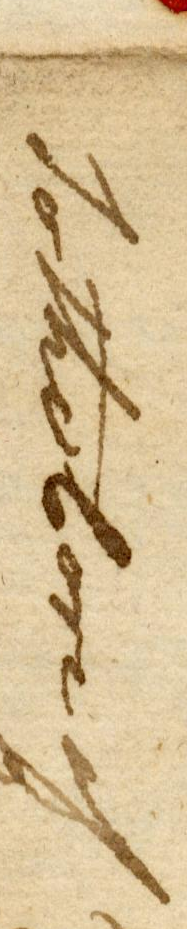To the care of
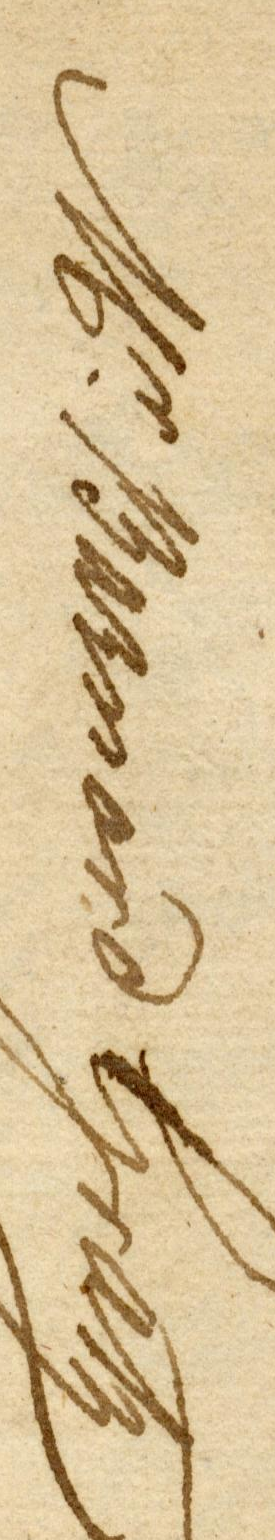M^r. Barnard Gratz
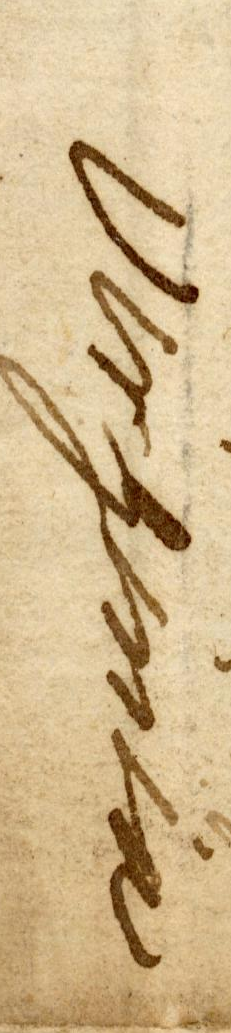Virginia
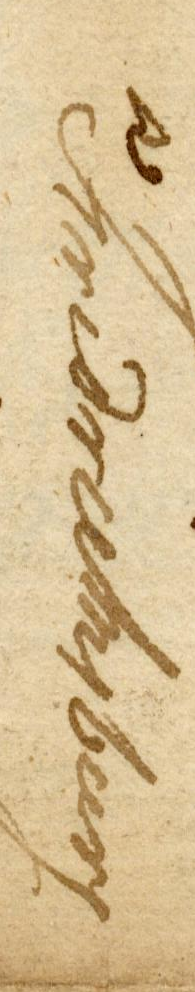Fredricksburg
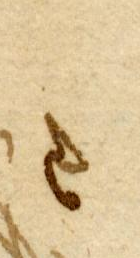at
